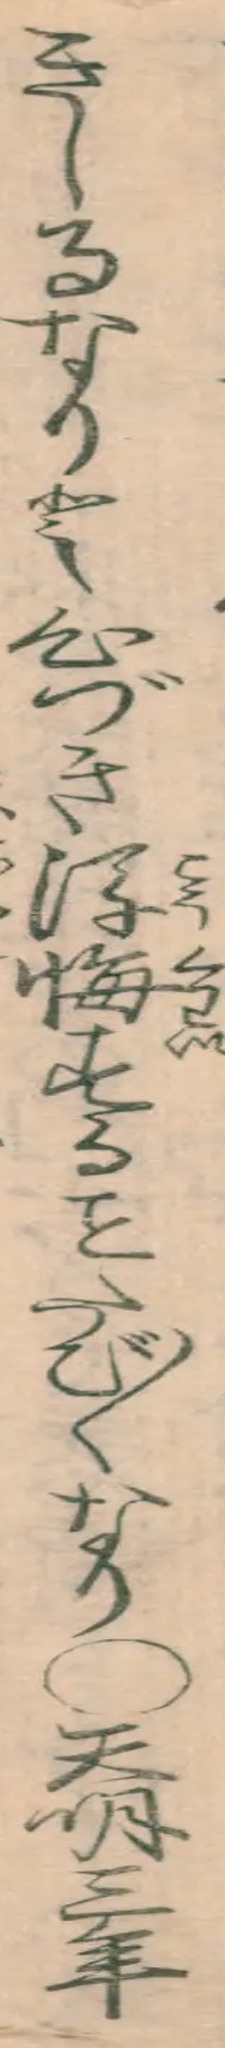きし事なりと心づき後悔することたび〳〵なり○天明三年
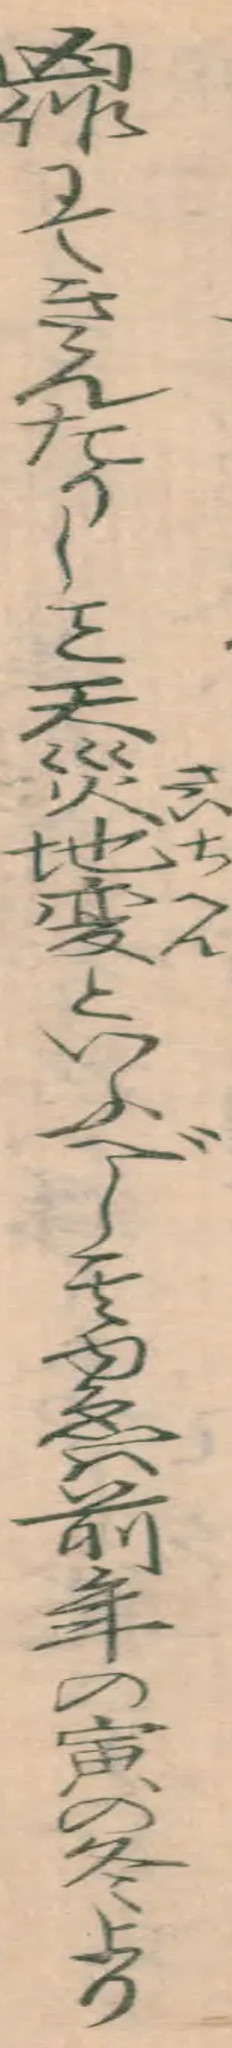凶作にてきゝんたりしこと天災地変といふべし其ゆゑは前年の寅の冬より
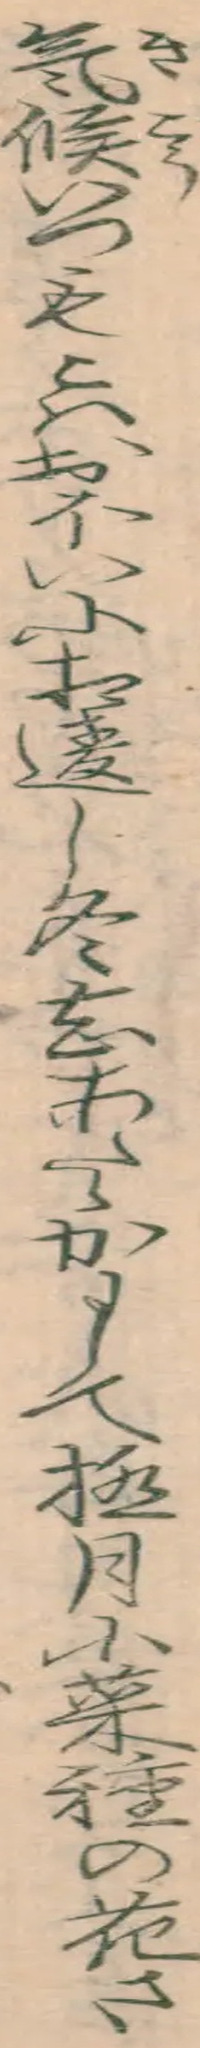気候いつもとはおほいに相違し冬甚あたゝかにて極月に菜種の花さ
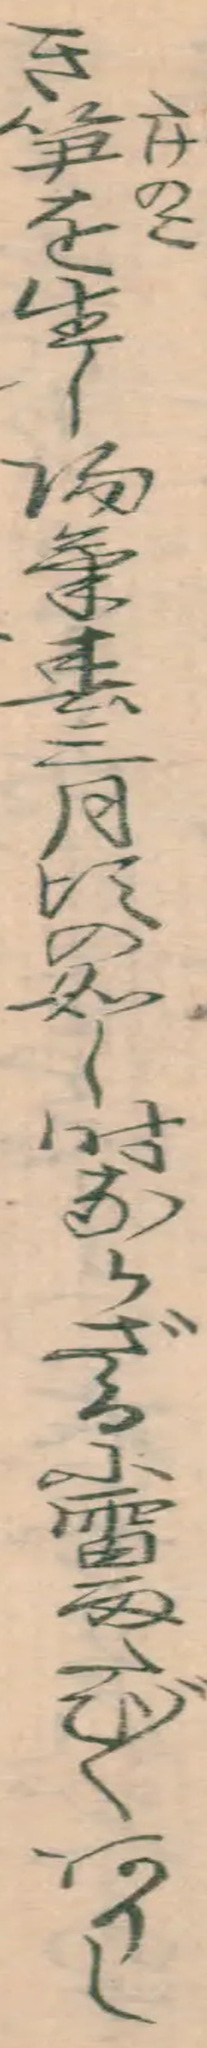き笋を生し陽気春三月頃の如し時ならざるに雷雨たび〳〵ありし
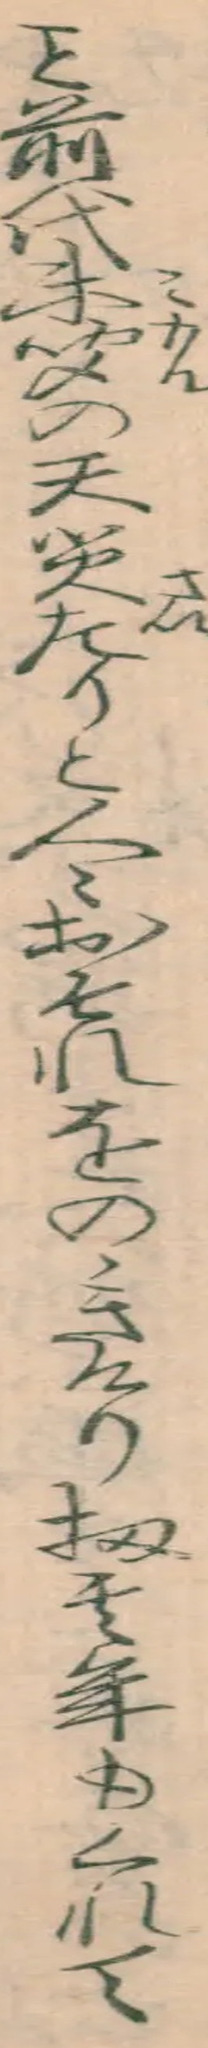こと前代未聞の天災たりと人々おそれをのゝきけり扨其年もくれて
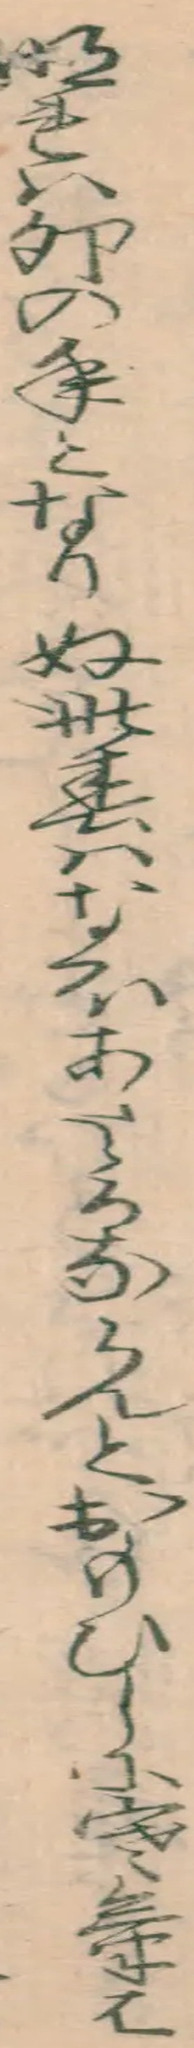明れは卯の年となりぬ此春はなほあたゝかならんとおもひしに寒気は
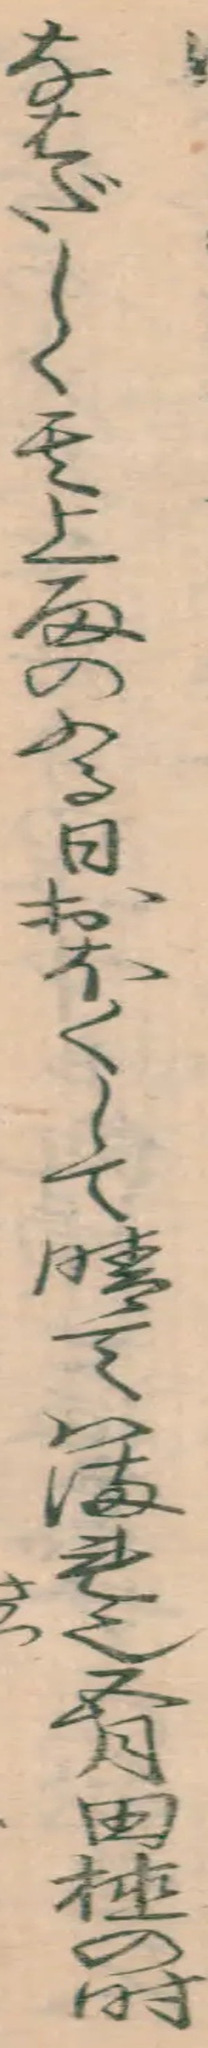なはだしく其上雨のふる日おほくして晴天はまれ也五月田植の時
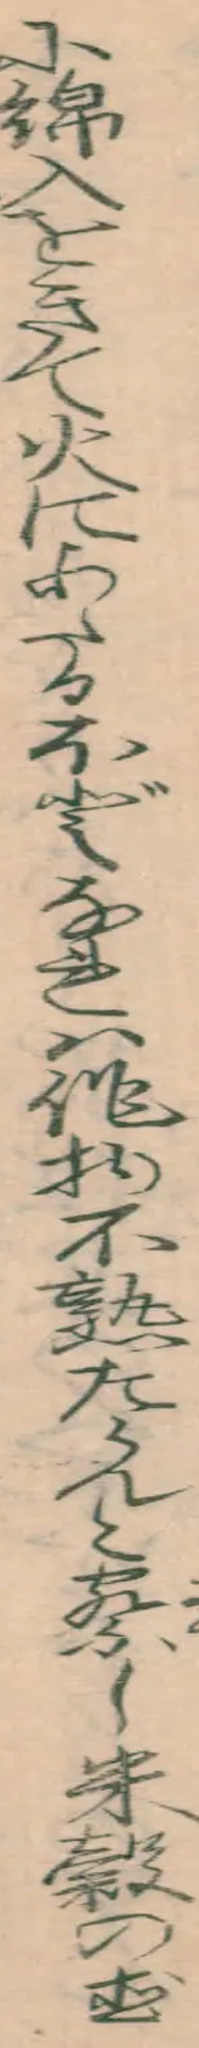に綿入をきて火にあたるほどなれは作物不熟たらんと察し米穀の直
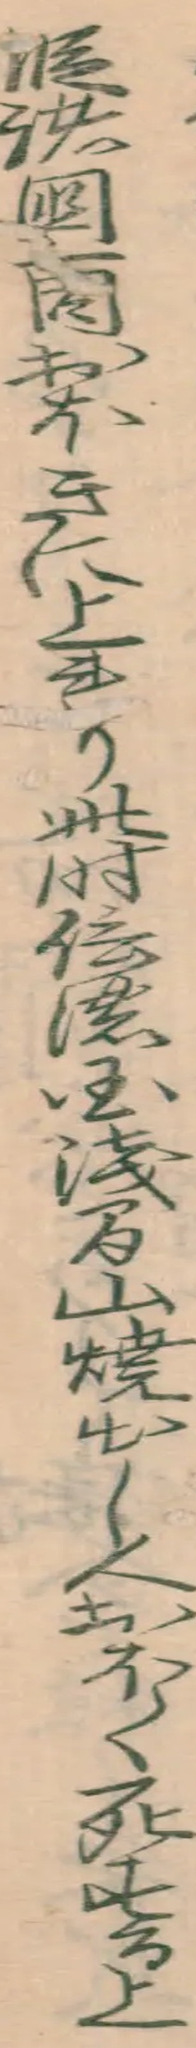段諸国一同おほきに上れり此時信濃国浅間山焼出し人おほく死する上
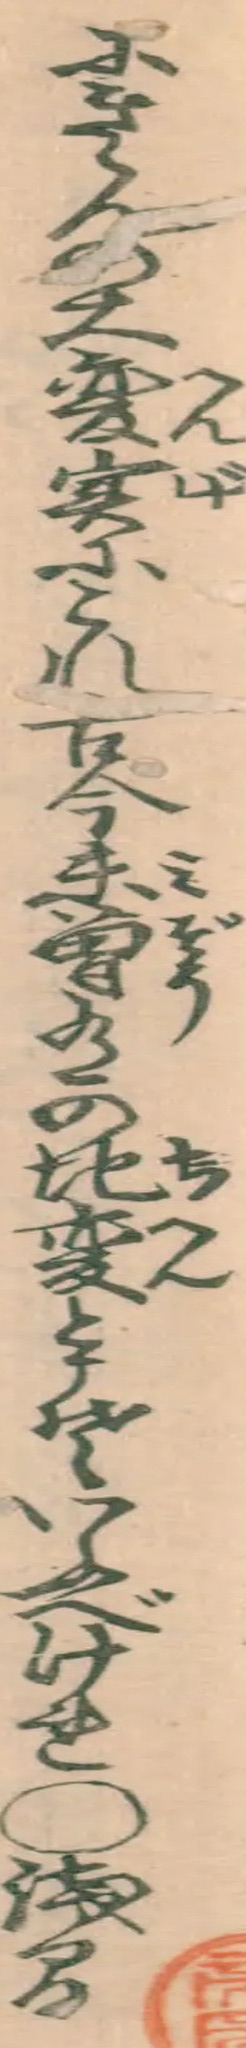にきゝんの大変実にこれ古今未曽有の地変とこそいふべけれ○浅間
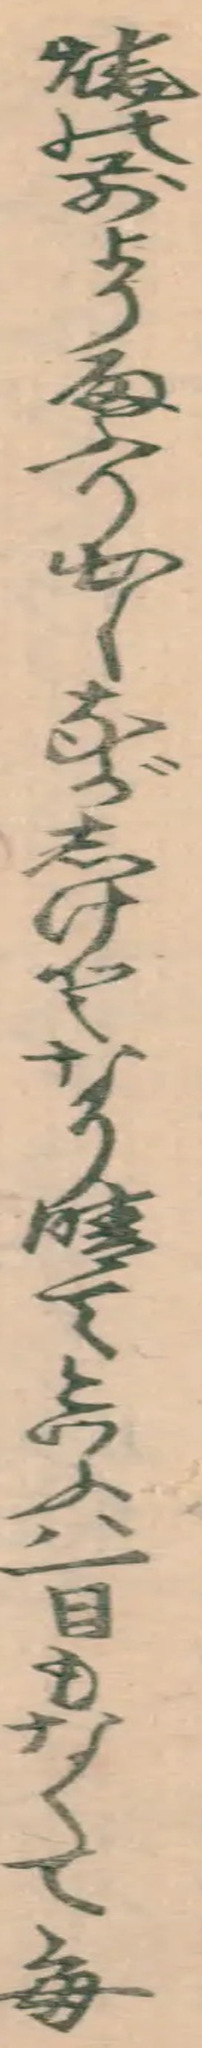焼の前より雨ふり出しながしけとなり晴天といふは一日もなくて毎
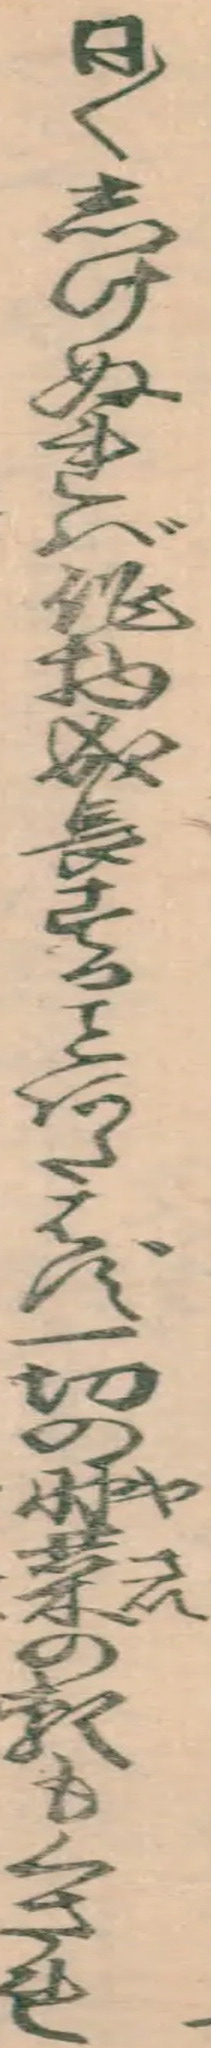日〳〵しけぬれば作物成長することあたはず一切の野菜の類もくされ
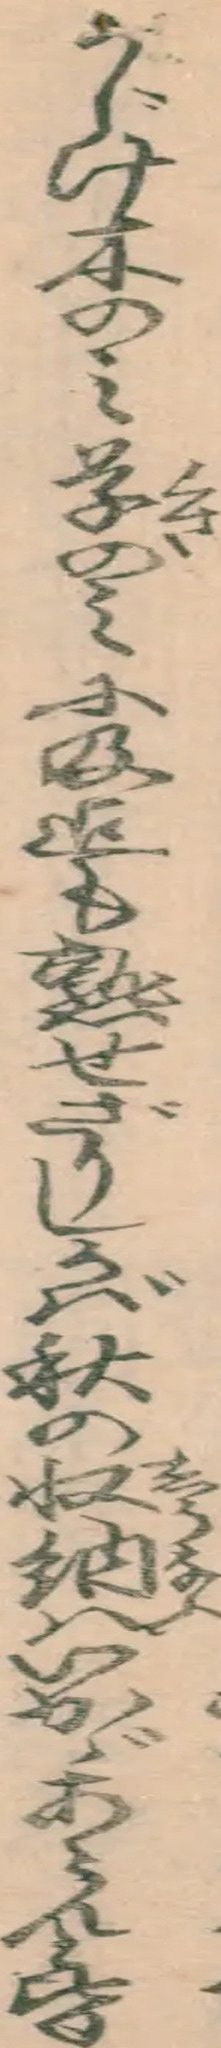かじけ木のみ草のみに及迄も熟せざりしかば秋の収納はいかゞあらんと皆
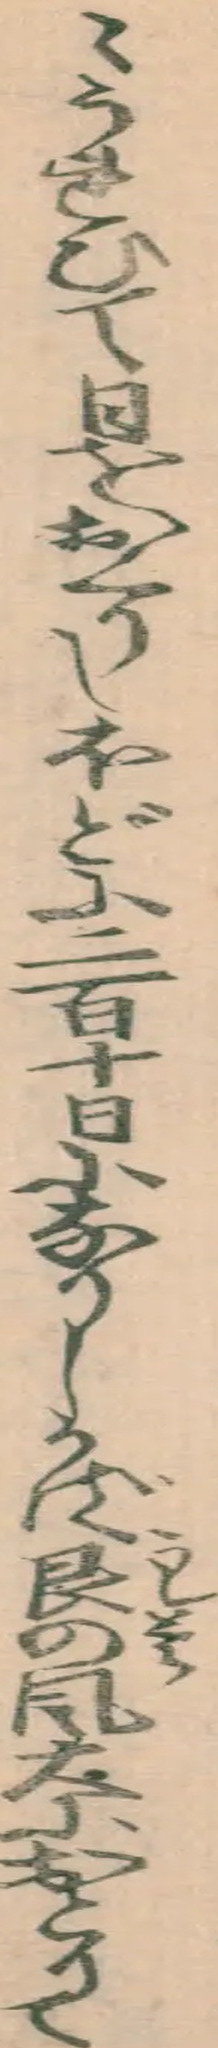々うれひて日をおくりしほどに二百十日になりしかば艮の風大におこりて
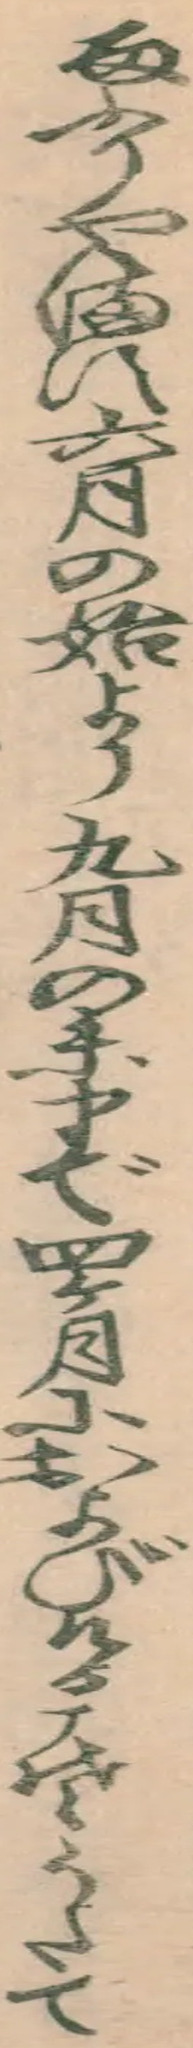雨ふりやます六月の始より九月の末まで四ヶ月におよびけるこそうたて
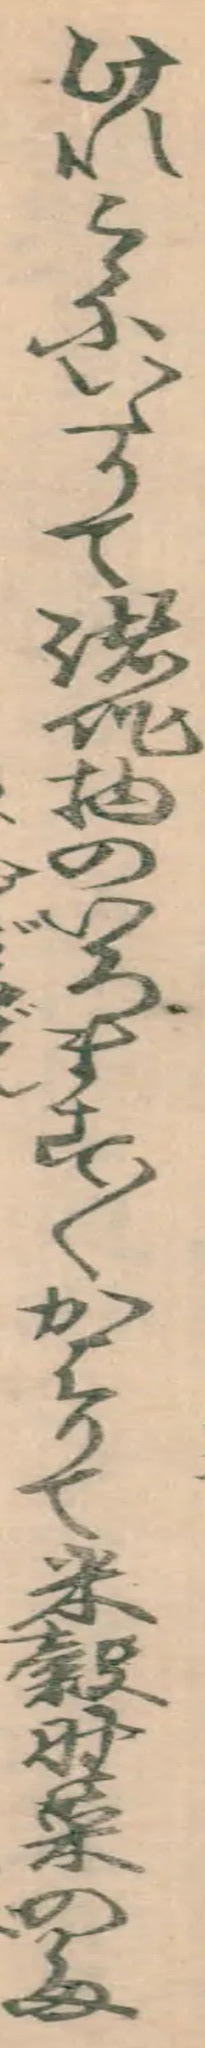けれこゝにいたりて諸作物のいろます〳〵かはりて米穀野菜のた
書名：日ごとの心得
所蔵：国立国会図書館 National Diet Library, JAPAN
